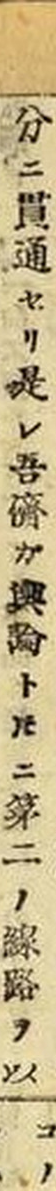分ニ貫通セリ是レ吾儕ガ與論ト𪜈ニ第二ノ線路ヲ以
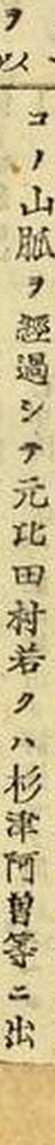コノ山脈ヲ經過シテ元比田村若クハ杉津阿曽等ニ出
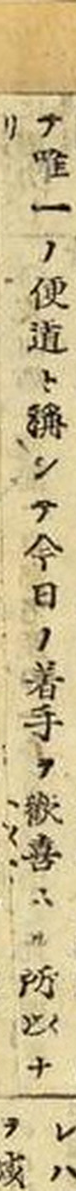テ唯一ノ便道ト稱シテ今日ノ着手ヲ歓喜スル所以ナ
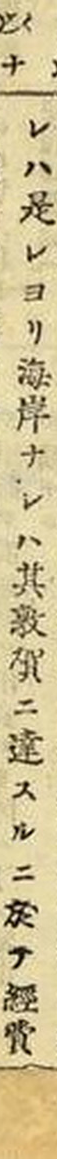レハ是レヨリ海岸ナレハ其敦賀ニ達スルニ於テ經費
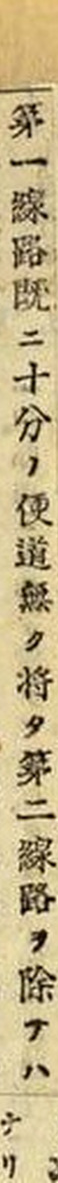第一線路既ニ十分ノ便道無ク將タ第二線路ヲ除テハ
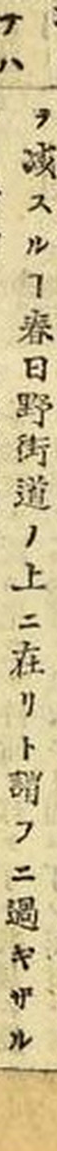ヲ減スルヿ春日野街道ノ上ニ在リト謂フニ過ギザル
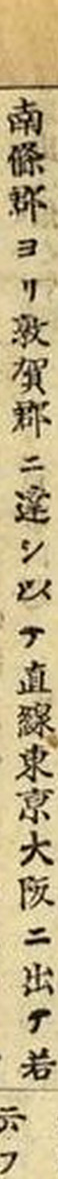南條郡ヨリ敦賀郡ニ達シ以テ直線東亰大阪ニ出テ若
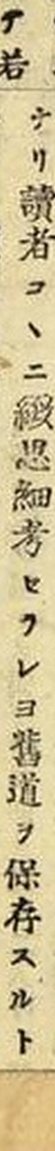ナリ讀者コヽニ緻思細考セラレヨ舊道ヲ保存スルト
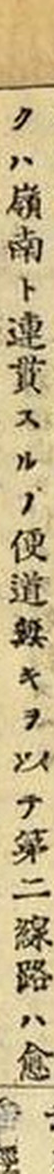クハ嶺南ト連貫スルノ便道無キヲ以テ第二線路ハ愈
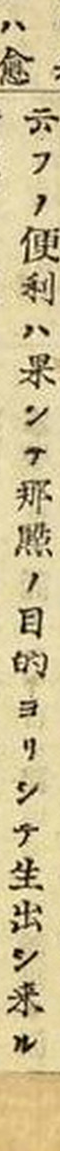云フノ便利ハ果シテ那點ノ目的ヨリシテ生出シ来ル
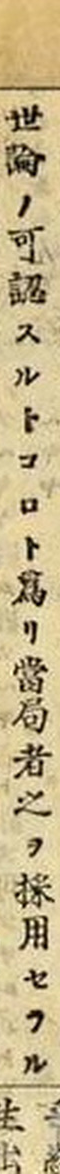世論ノ可認スルトコロト爲リ當局者之ヲ採用セラル
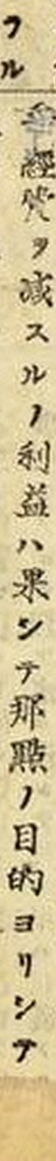争經費ヲ減スルノ利益ハ果シテ那點ノ目的ヨリシテ
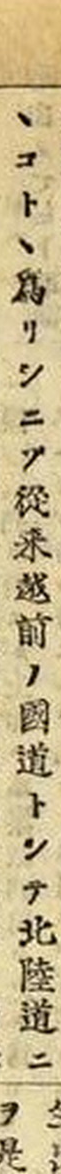ヽコトヽ爲リシニテ從来越前ノ國道トシテ北陸道ニ
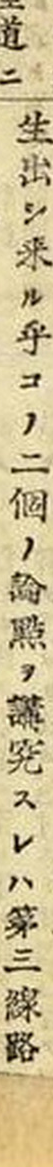生出シ来ル乎コノ二個ノ論點ヲ講究スレハ第三線路
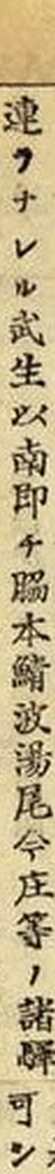連ラナレル武生以南即チ脇本鯖波湯尾今庄等ノ諸驛
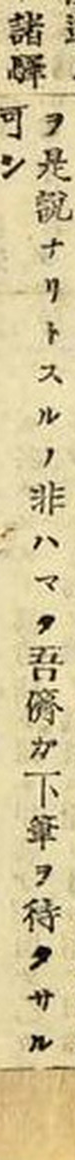ヲ是説ナリトスルノ非ハマタ吾儕ガ下筆ヲ待タサル
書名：温古集 五巻
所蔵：福井県文書館 Fukui Prefectural Archives
